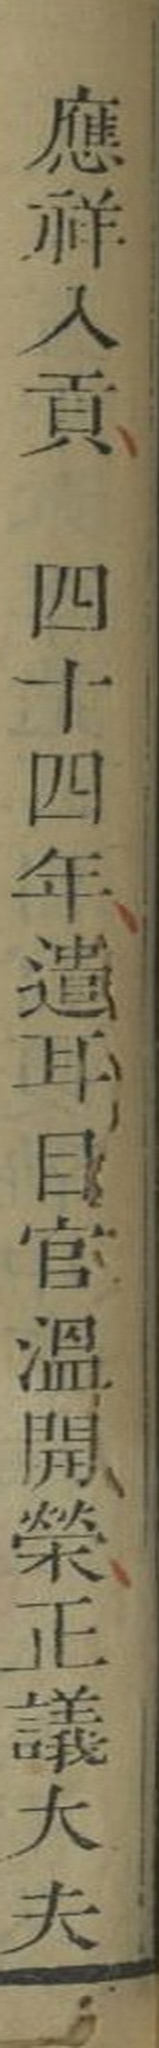応祥入貢四十四年遣耳目官温開栄正議大夫
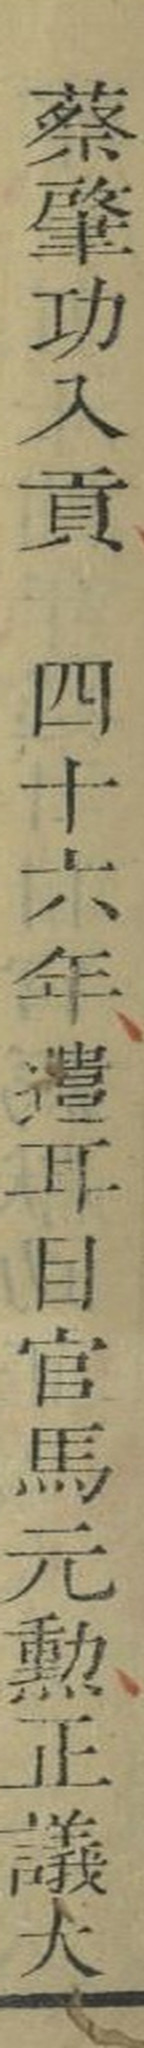蔡肇功入貢四十六年遣耳目官馬元勲正議大
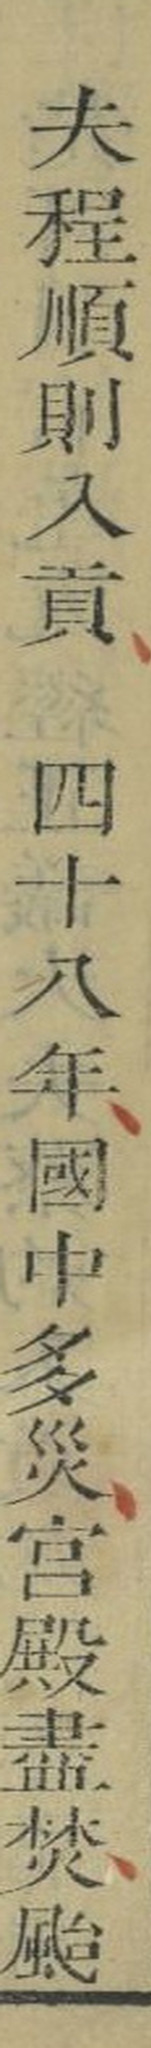夫程順則入貢四十八年国中多災宮殿尽焚颱
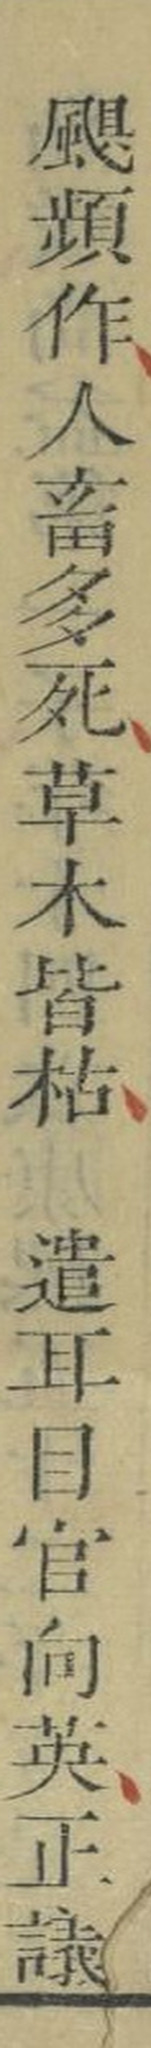颶頻作人畜多死草木皆枯遣耳目官向英正議
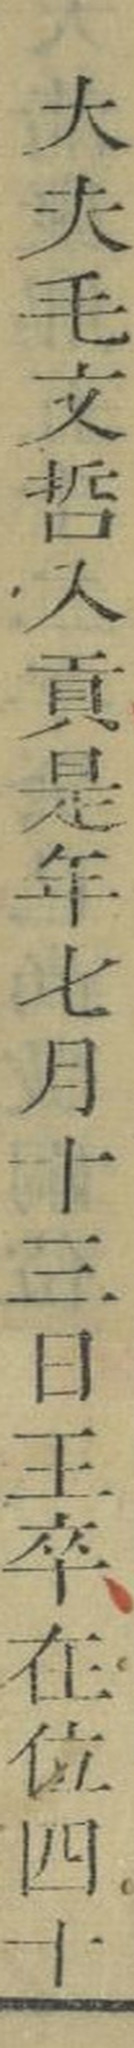大夫毛文哲入貢是年七月十三日王卒在位四十
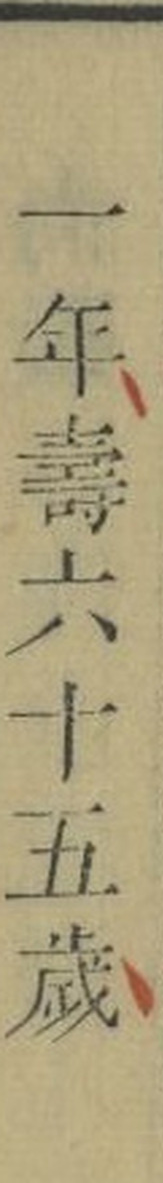一年寿六十五歳
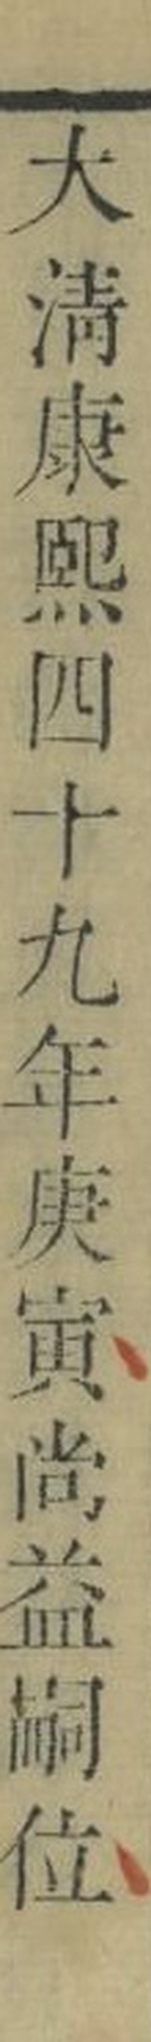大清康煕四十九年庚寅尚益嗣位
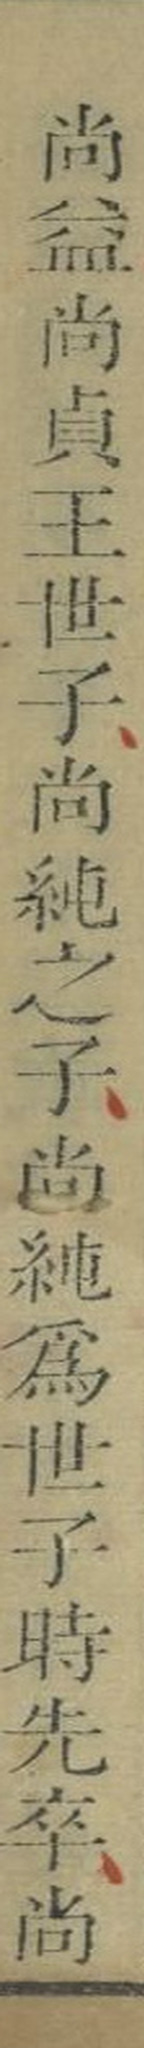尚益尚貞王世子尚純之子尚純為世子時先卒尚

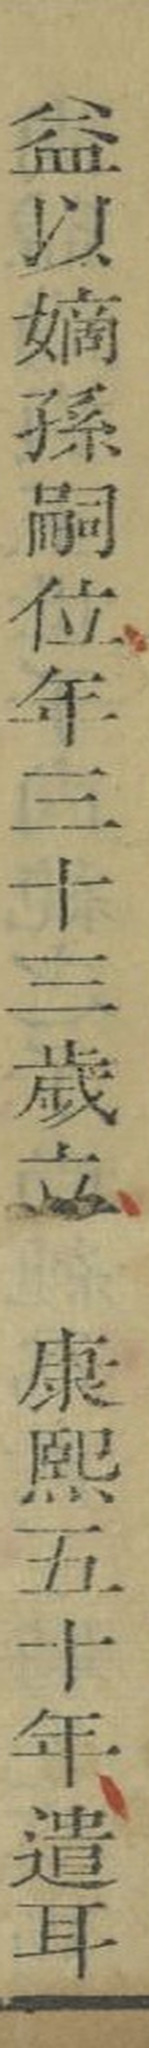益以嫡孫嗣位年三十三歳立康煕五十年遣耳
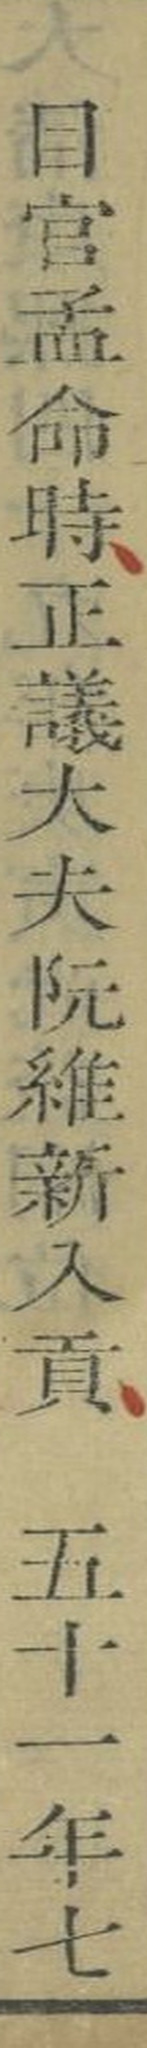目官孟命時正議大夫阮維新入貢五十一年七
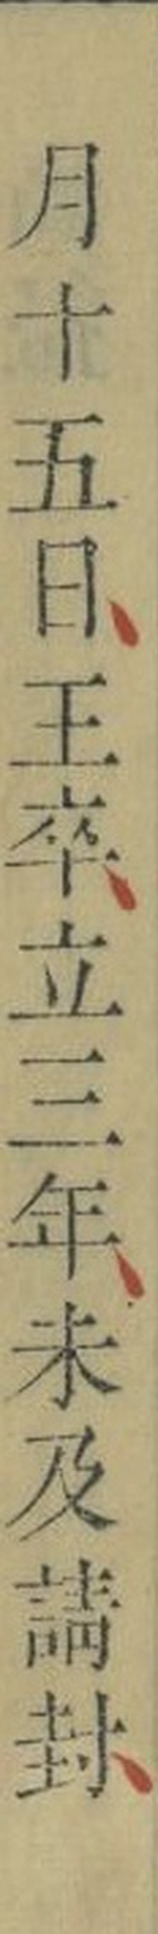月十五日王卒立三年未及請封
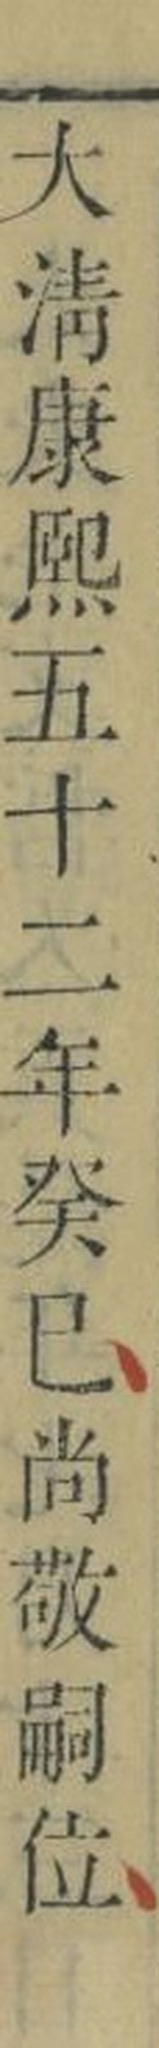大清康煕五十二年癸巳尚敬嗣位
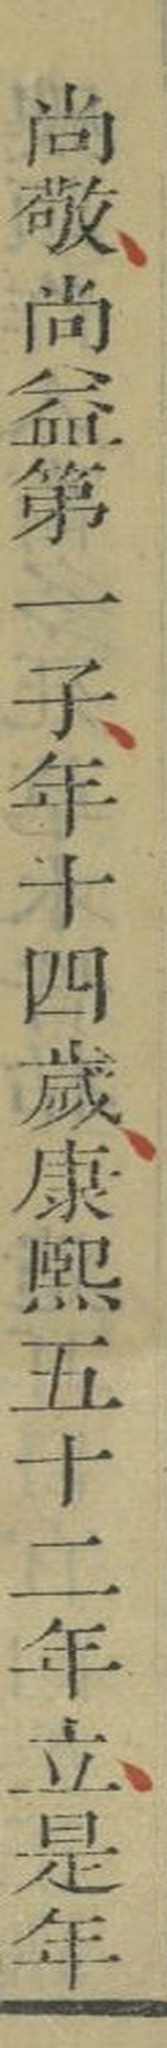尚敬尚益第一子年十四歳康煕五十二年立是年
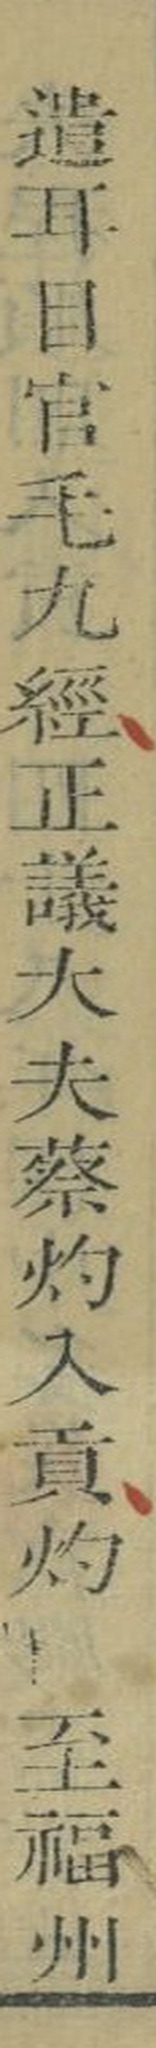遣耳目官毛九経正議大夫蔡灼入貢灼至福州
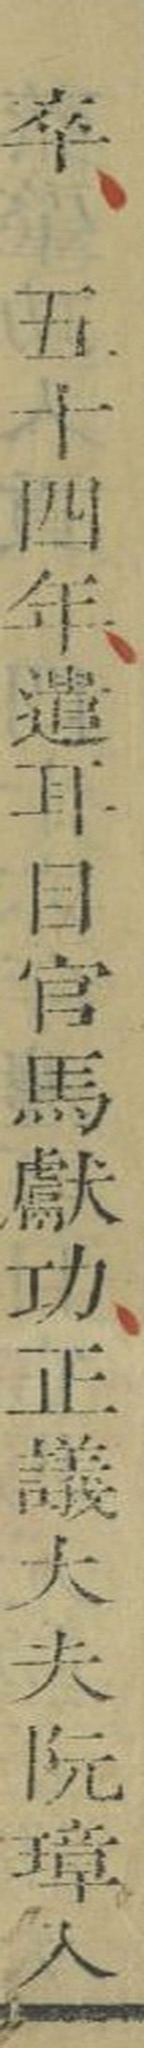卒五十四年遣耳目官馬献功正議大夫阮璋入
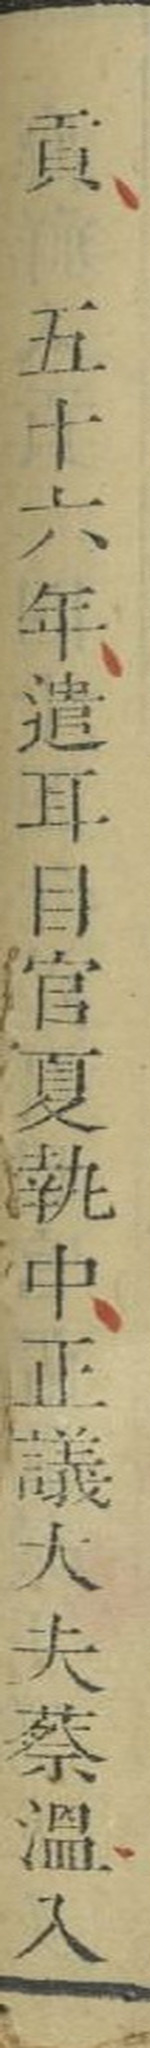貢五十六年遣耳目官夏執中正議大夫蔡温入
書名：中山伝信録 巻三
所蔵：University of the Ryukyus Library
